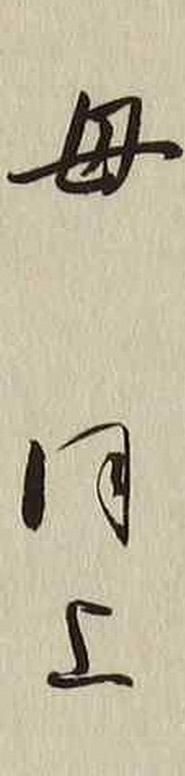母同上
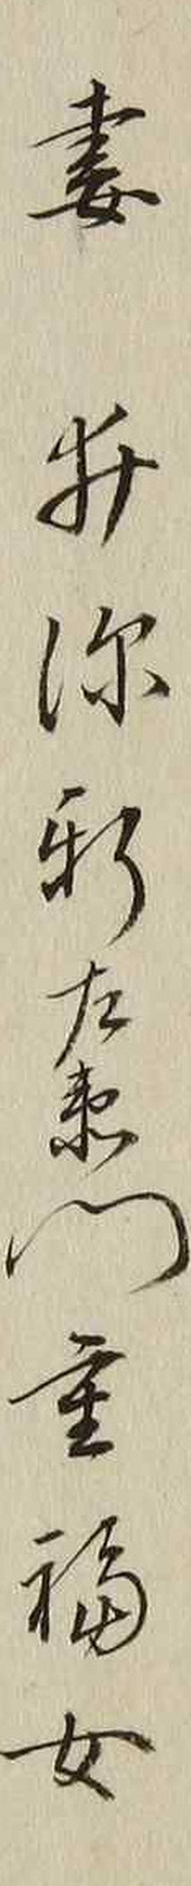妻井深新左衛門重福女
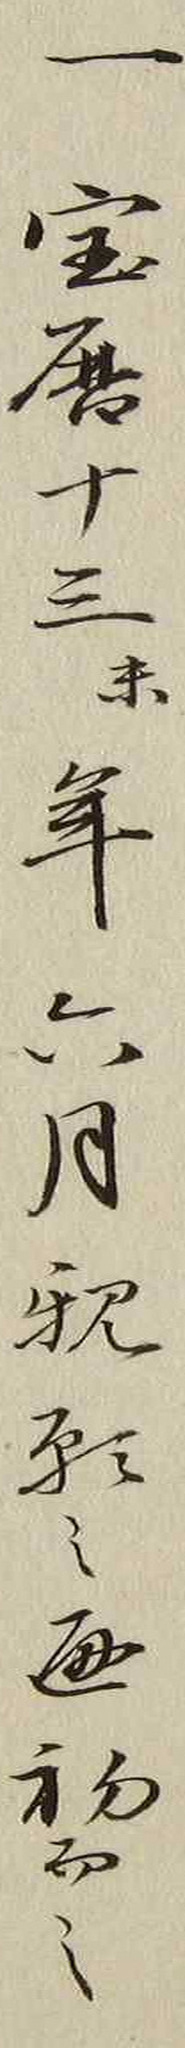一宝暦十三未年六月親願之通初而之
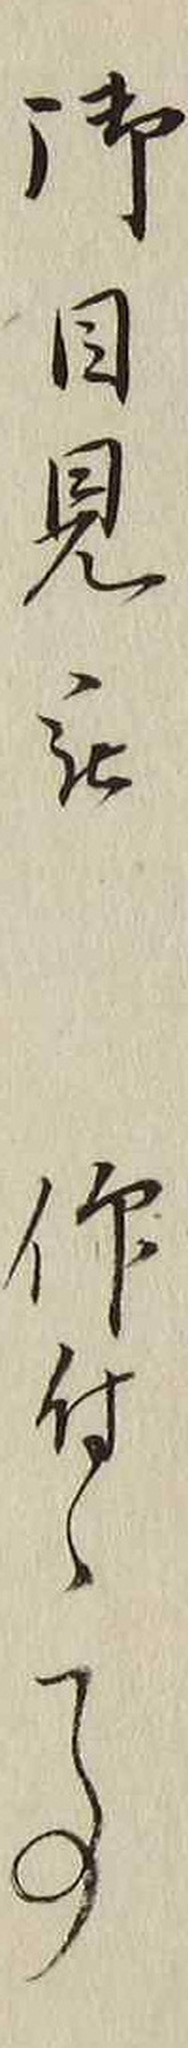御目見被仰付候事
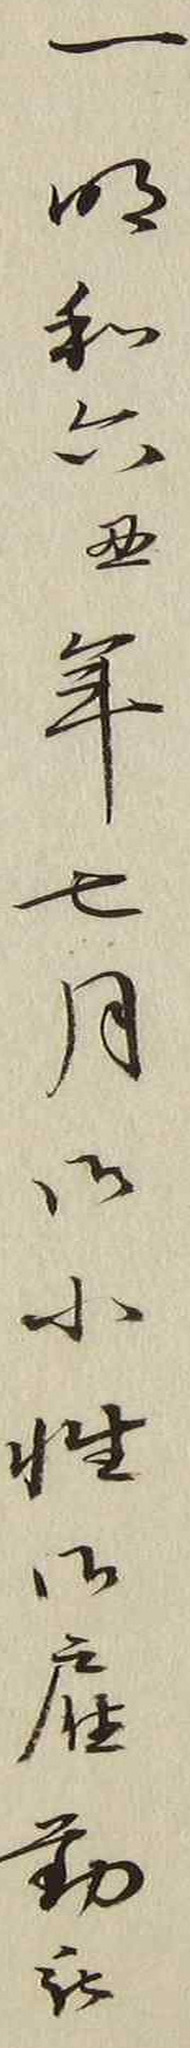一明和六丑年七月御小性御雇勤被
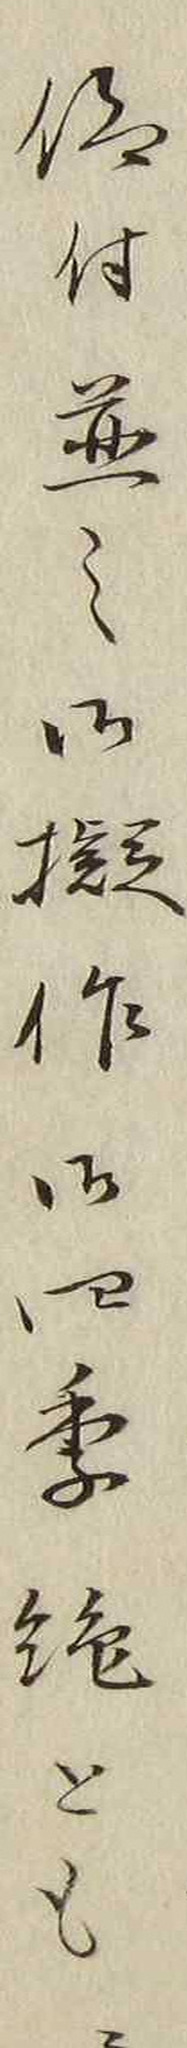仰付並之御擬作御四季絶ともニ
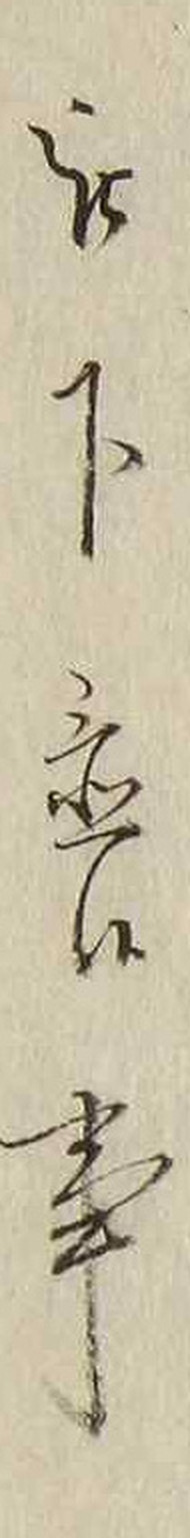被下置候事

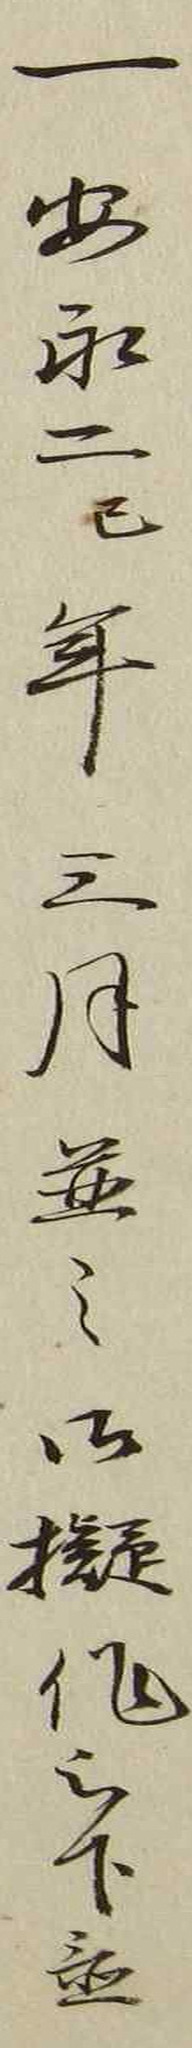一安永二巳年三月並之御擬作被下置
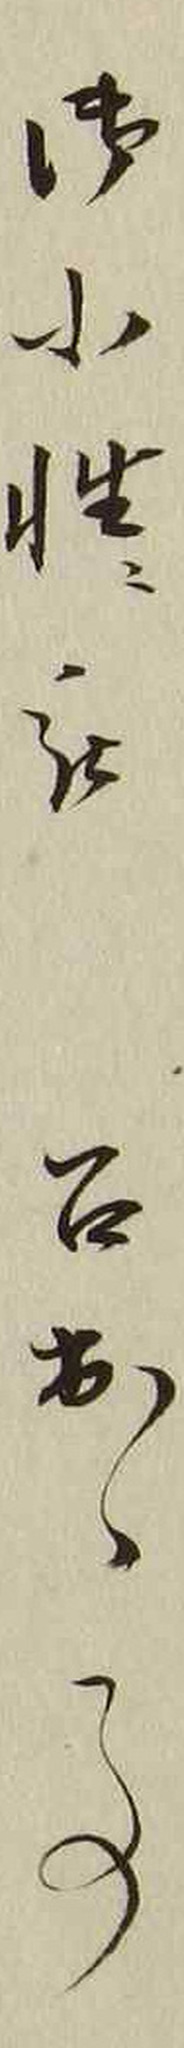御小性に被召出候事
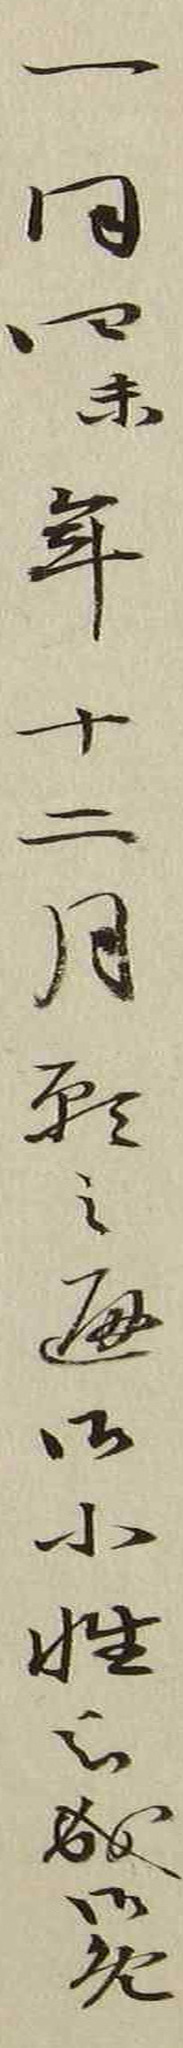一同四未年十二月願之通御小性被成御免
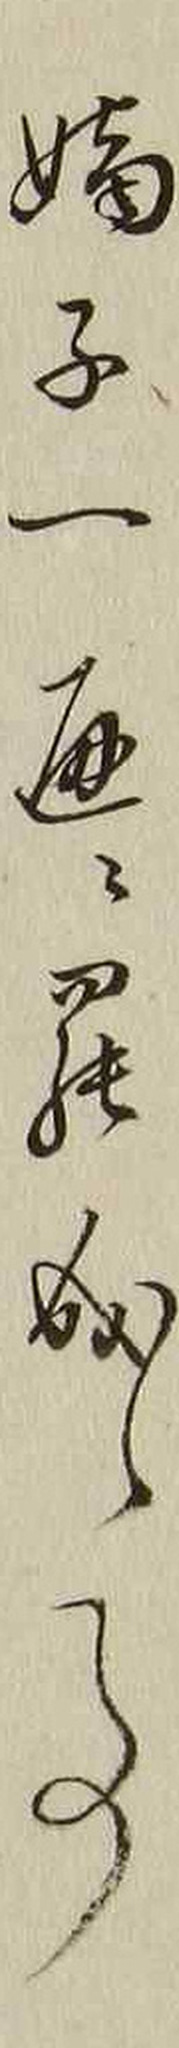嫡子一通ニ罷成候事
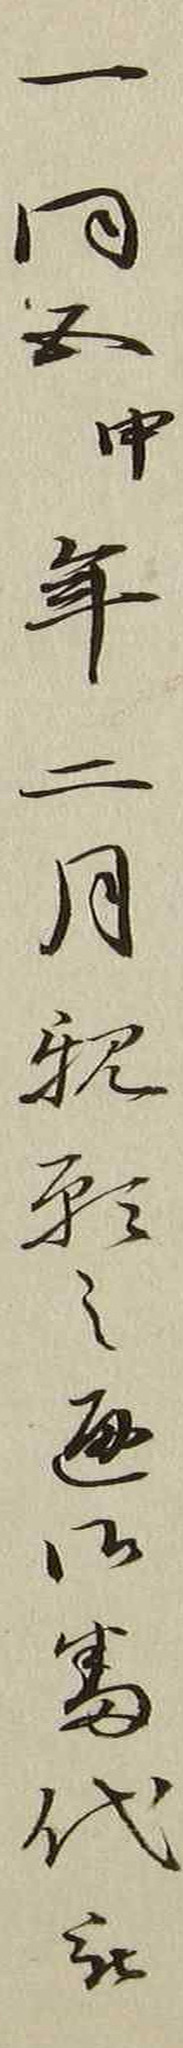一同五申年二月親願之通御番代被
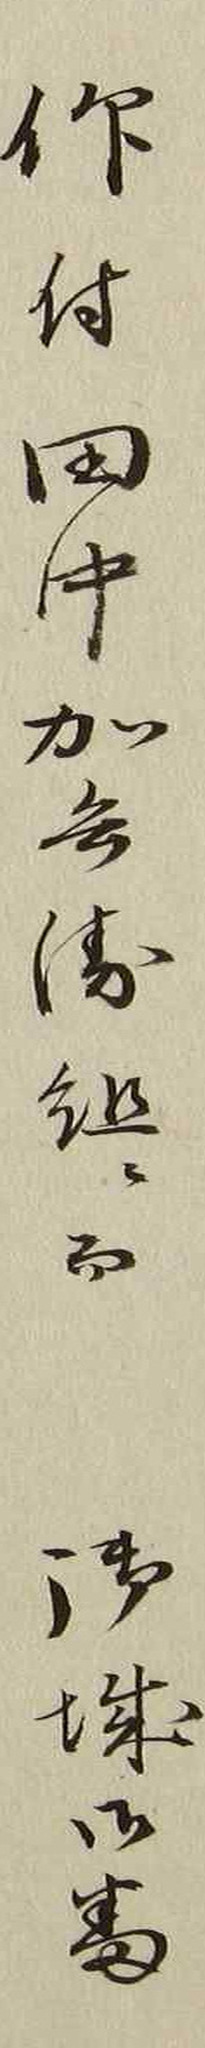仰付田中加兵衛組ニ而御城御番
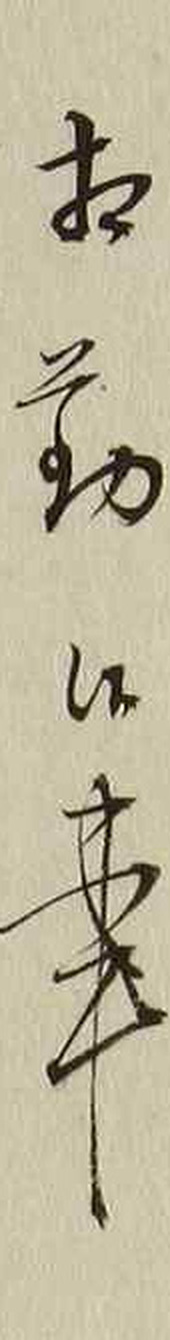相勤候事
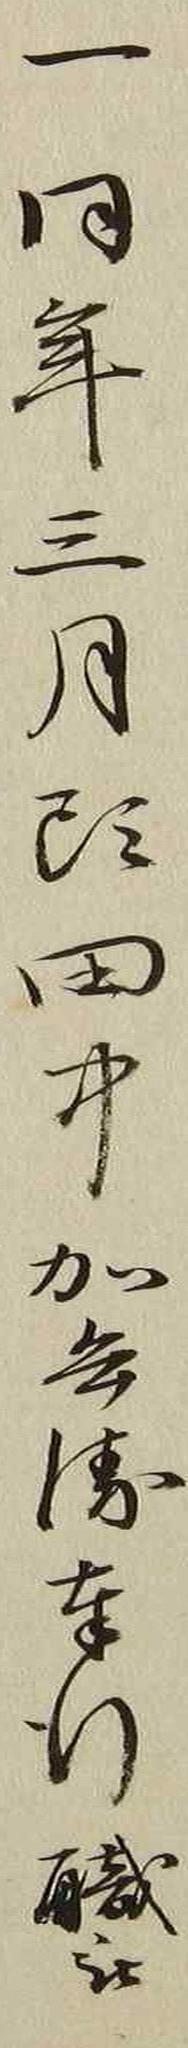一同年三月頭田中加兵衛奉行職被
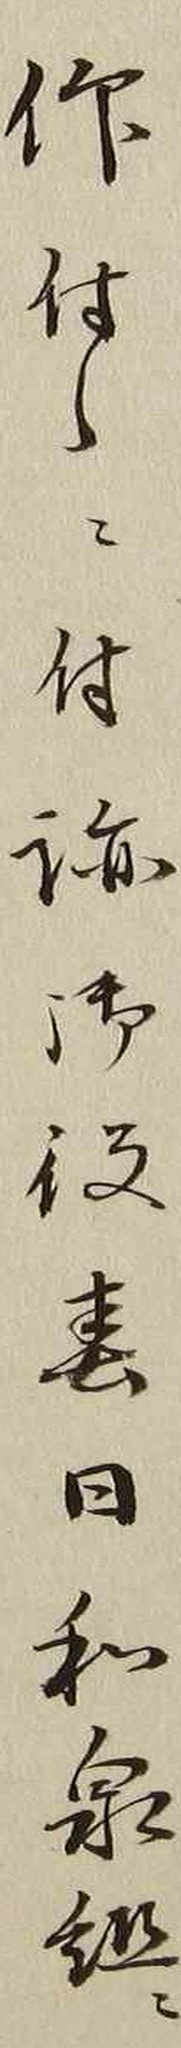仰付候ニ付跡御役春日和泉組ニ
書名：諸士系譜　巻之22　い之部22
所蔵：会津若松市立会津図書館
